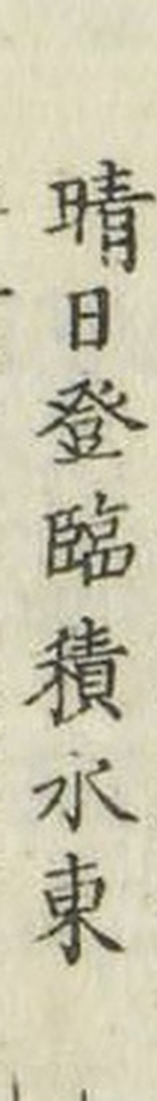晴日登臨積水東
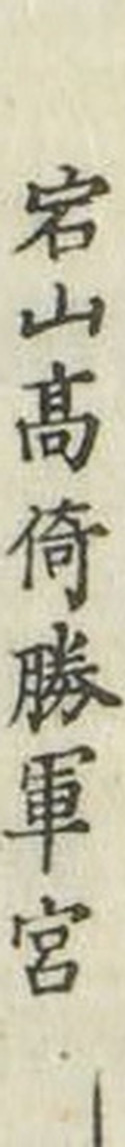宕山高倚勝軍宮
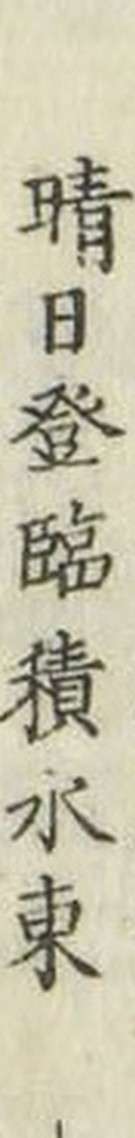晴日登臨積水東
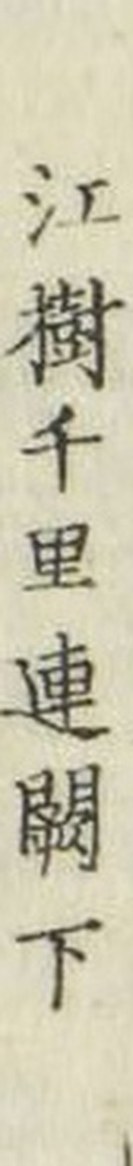江樹千里連闕下
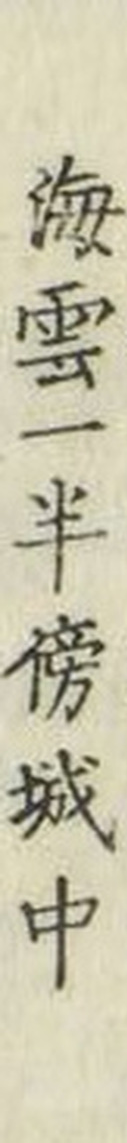海雲一半傍城中
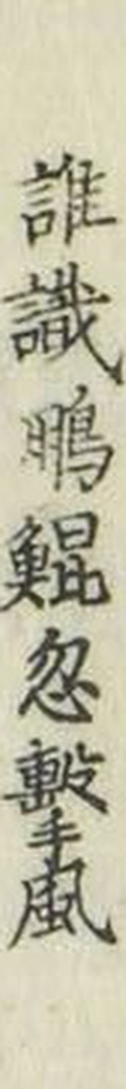誰識鵬鯤忽撃風
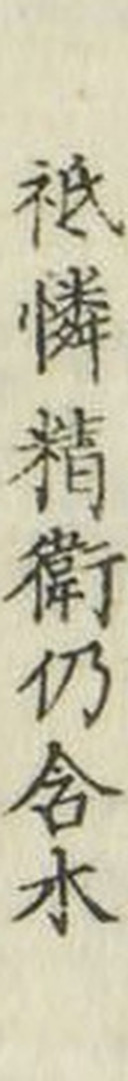祇憐精衛仍含水
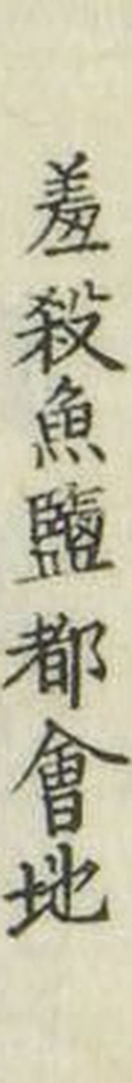羞殺魚監都會地
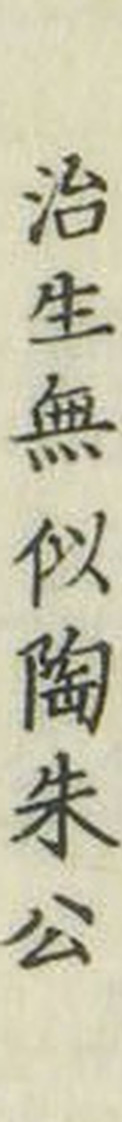治生無似陶朱公
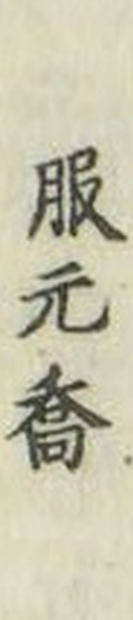服元喬

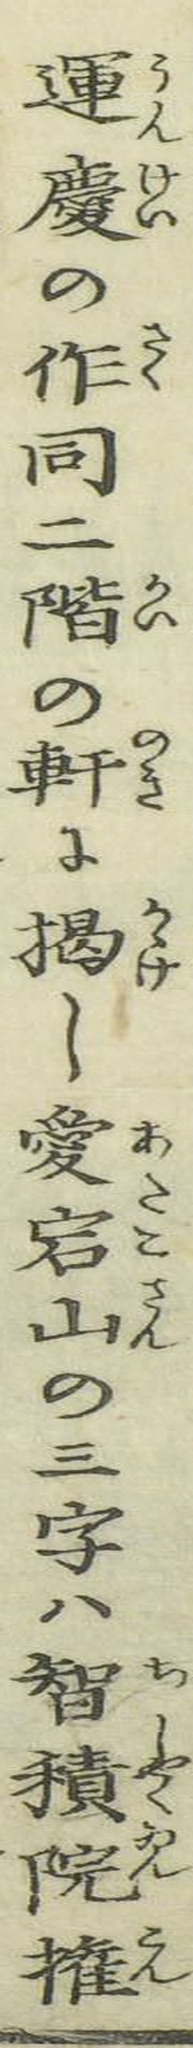運慶の作同二階の軒に掲し愛宕山の三字は智積院権
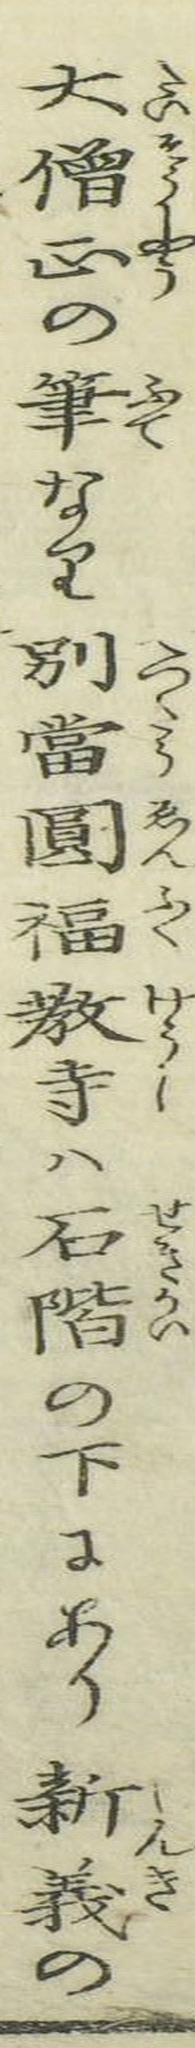大僧正の筆なり別當圓福教寺は石階の下にあり新義の
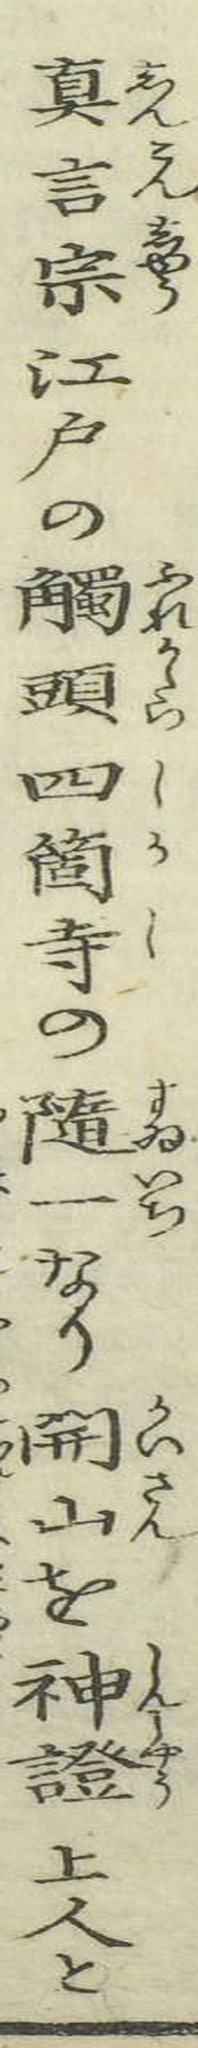真言宗江戸の触頭四箇寺の随一なり開山を神證上人と
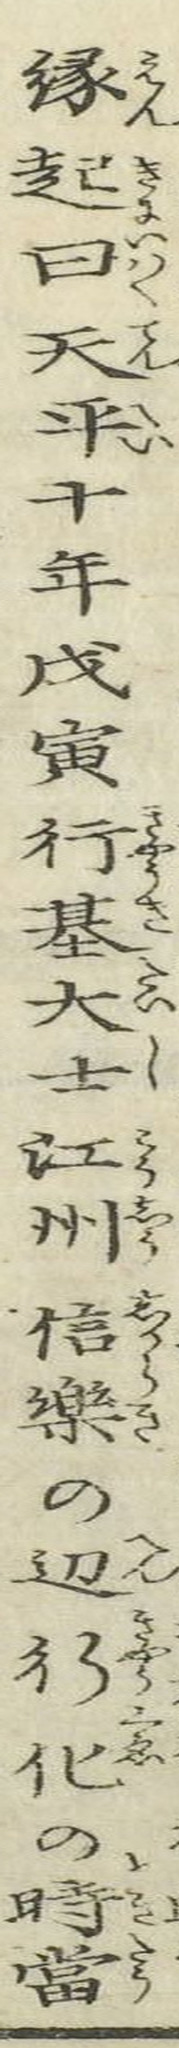縁起曰天平十年戊寅行基大士江州信楽の辺行化の時當
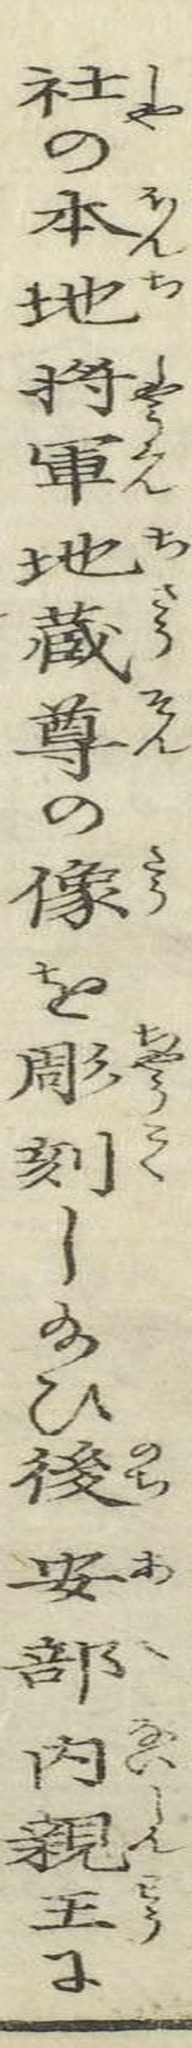社の本地将軍地蔵尊の像を彫刻し給ひ後安部内親王に
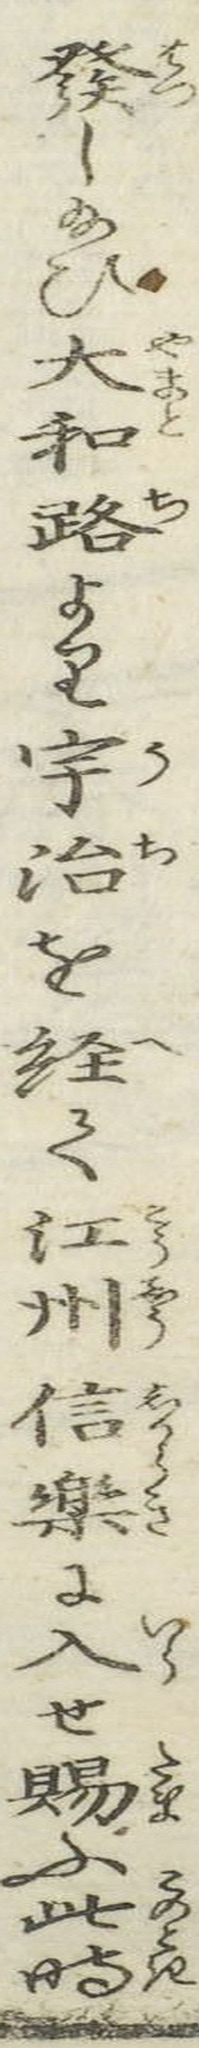發し給ひ大和路より宇治を経て江州信楽に入せ賜ふ此時
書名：江戸名所図会 20巻 巻之3
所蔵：東京学芸大学教育コンテンツアーカイブ
